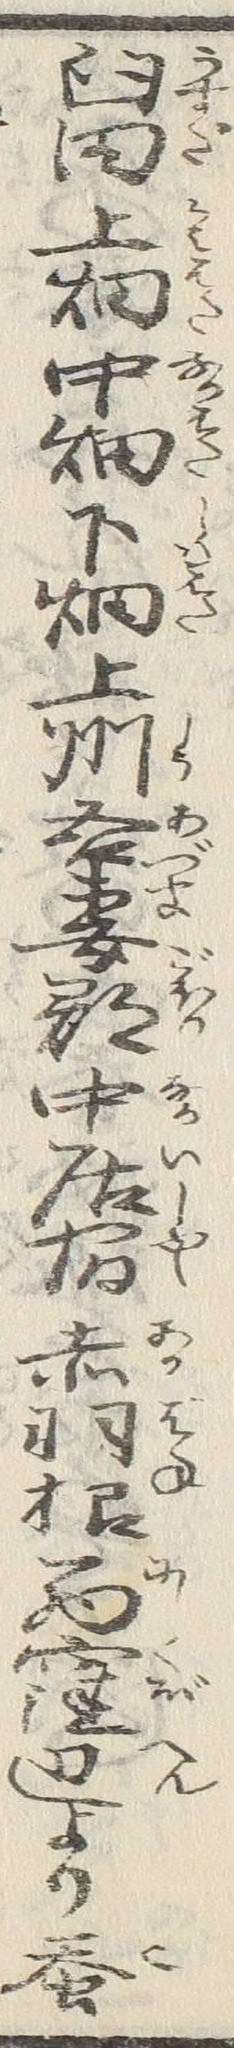臼田上畑中畑下畑上州吾妻郡中居宿赤羽根西窪辺より蚕
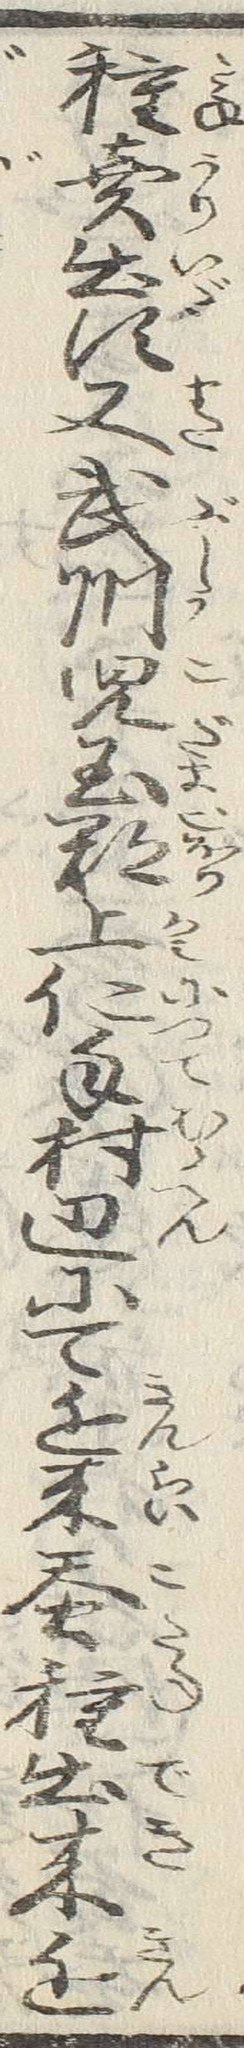種賣出す又武州児玉郡上仁手村辺にて近来蚕種出来近
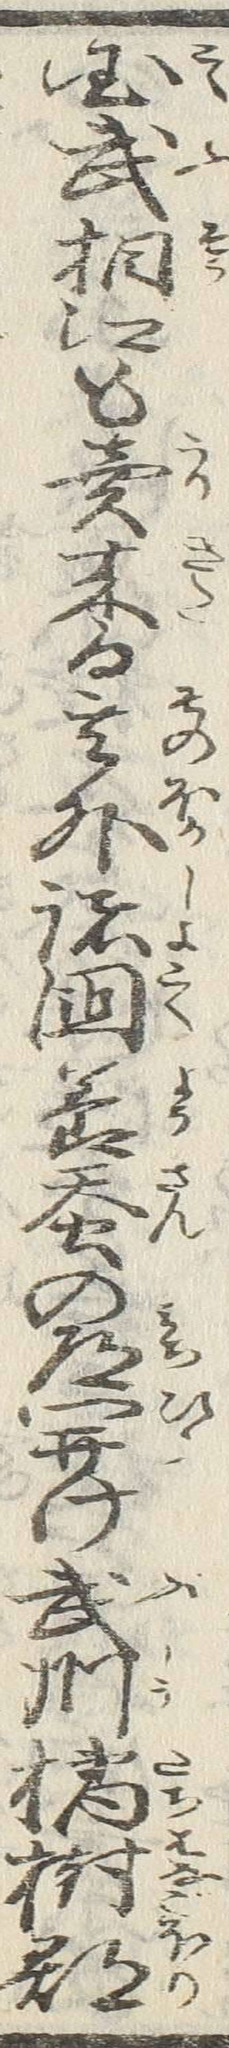國武相えも賣来る其外諸国養蚕の道開け武州橘樹郡
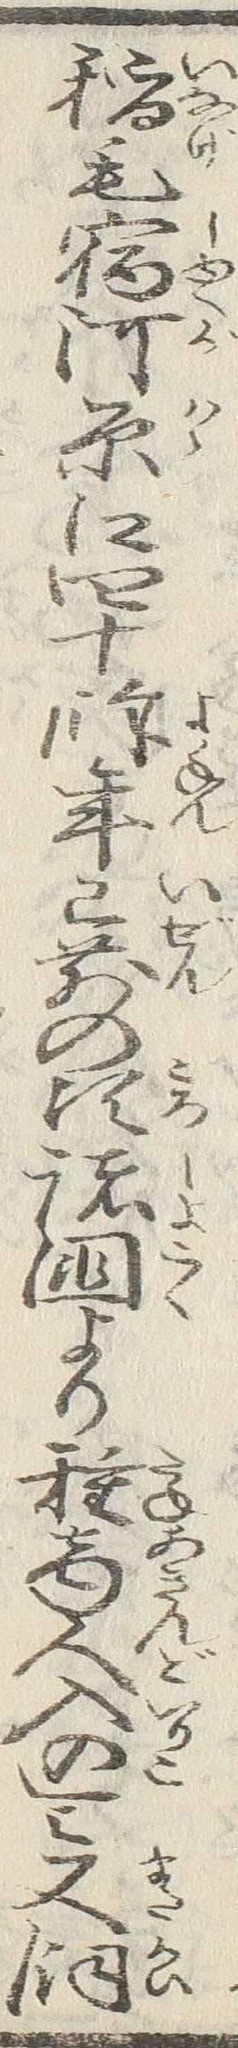稲毛宿河原え四十餘年已前の頃諸国より種商人入込み又飼
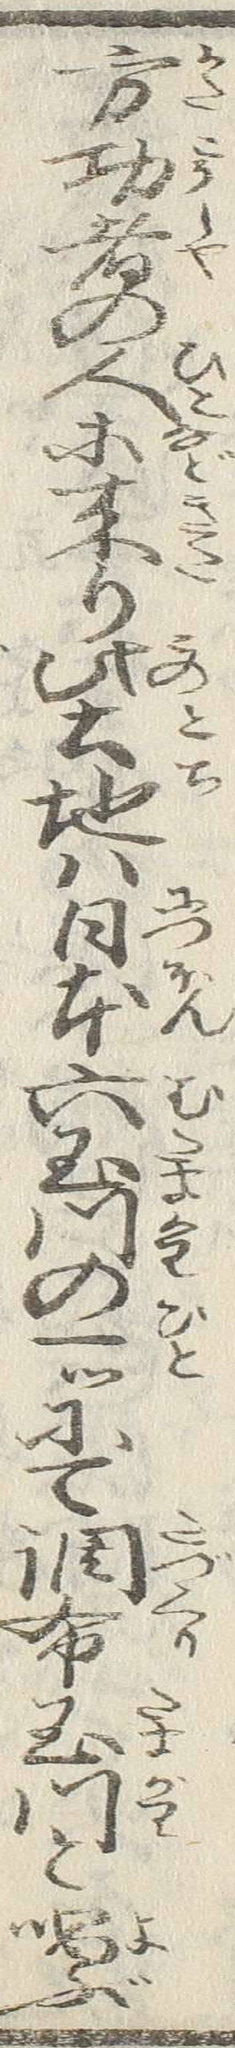方功者の人等来り此土地は日本六玉川の一ッにて調布玉川と唱ぶ
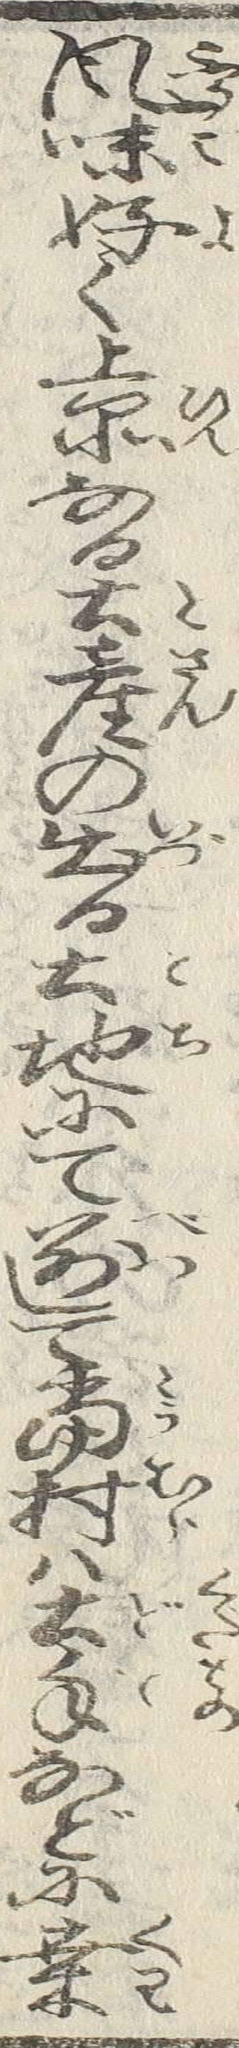風味好く上品なる土産の出る土地にて別して当村は土手などに桑
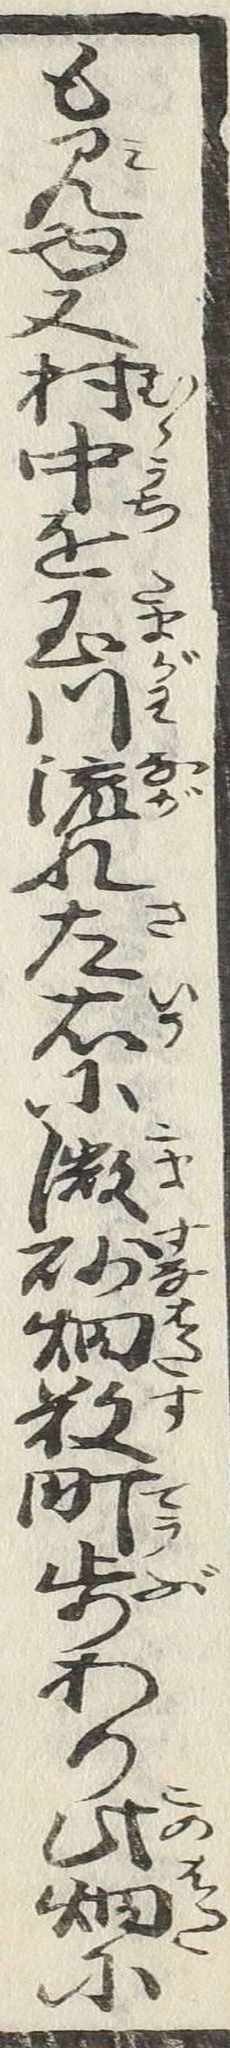も見ゆ又村中を玉川流れ左右に微砂畑数町歩あり此畑に
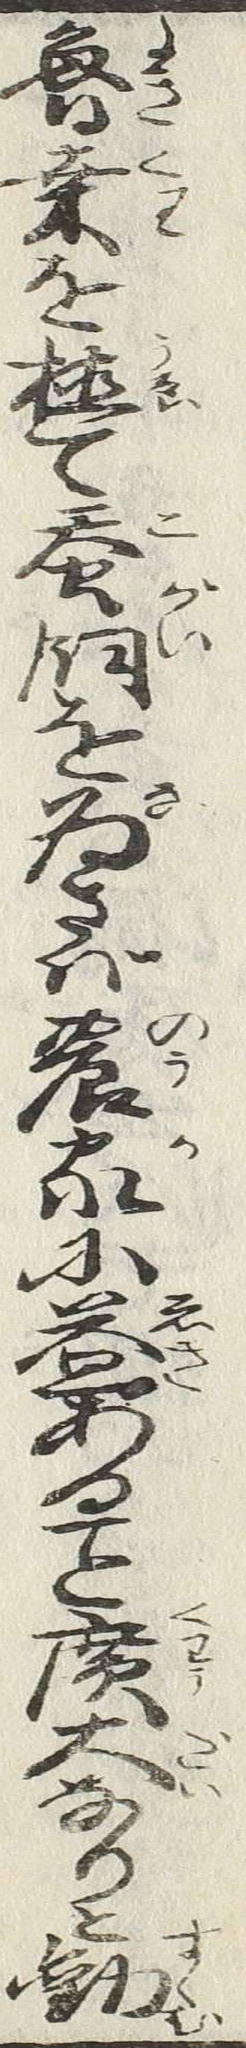魯桑を植て蚕飼を為さば農家に益あること廣大なりと勧
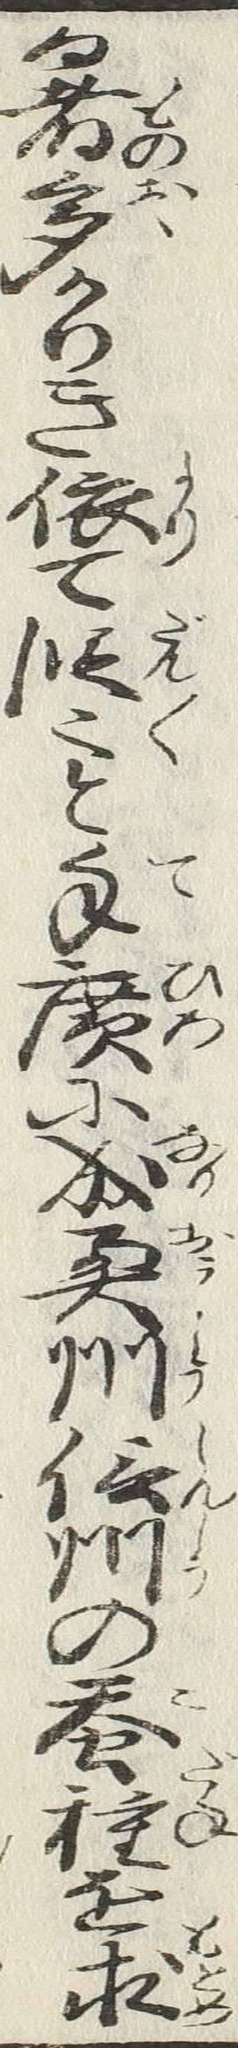る者多かりき依て段々と手廣に成奥州信州の蚕種を求
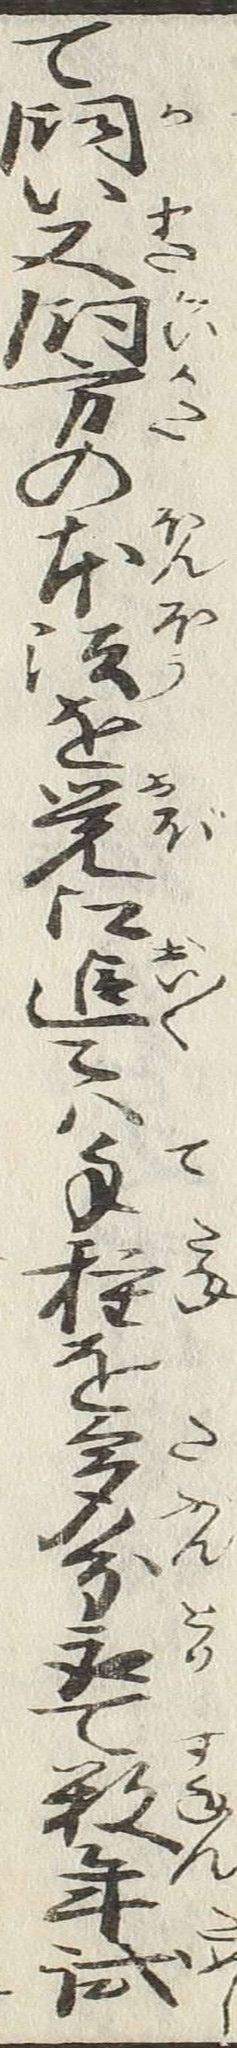て飼い又飼方の本法を覚え追々は手種を多分取て数年試
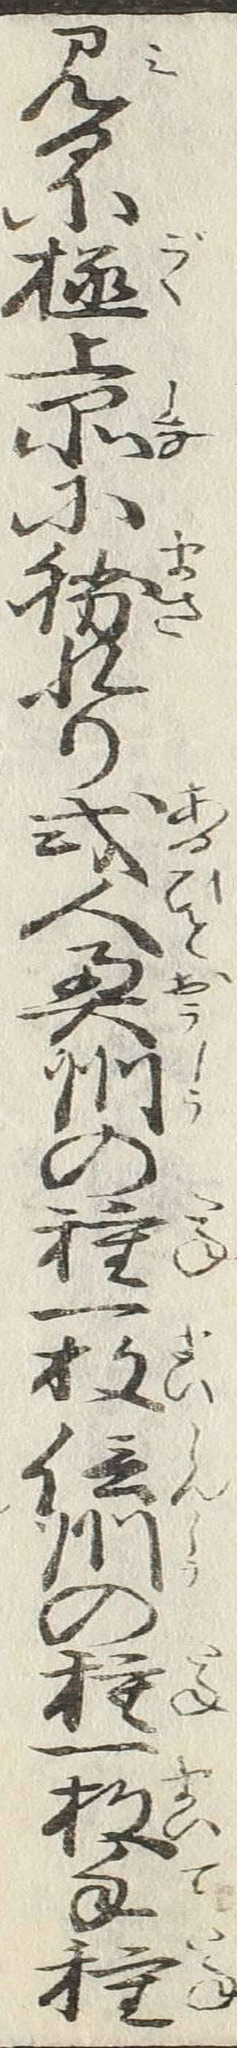見るに極上品に勝れり或人奥州の種一枚信州の種一枚手種
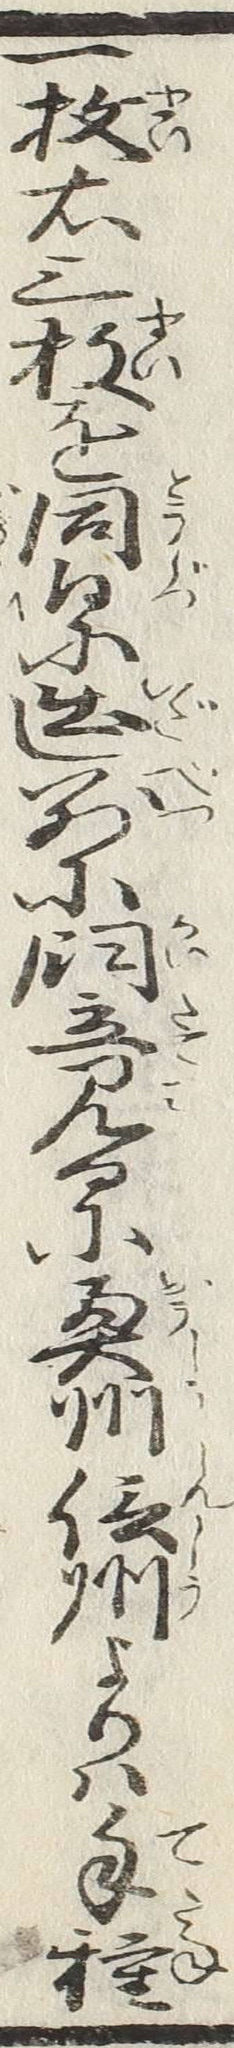一枚右三枚を同日に出し別に飼立見るに奥州信州よりは手種
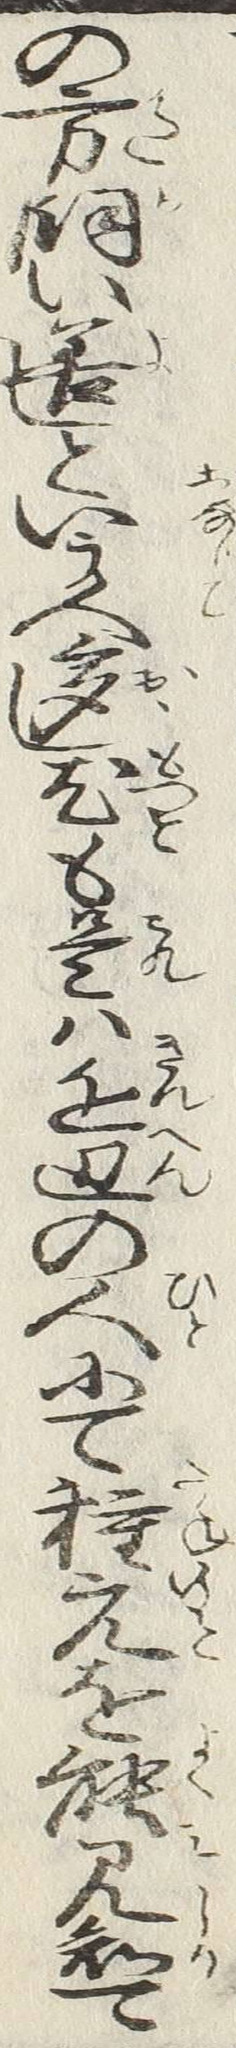の方飼い善しという人多し尤も是は近辺の人にて種元を能見知て
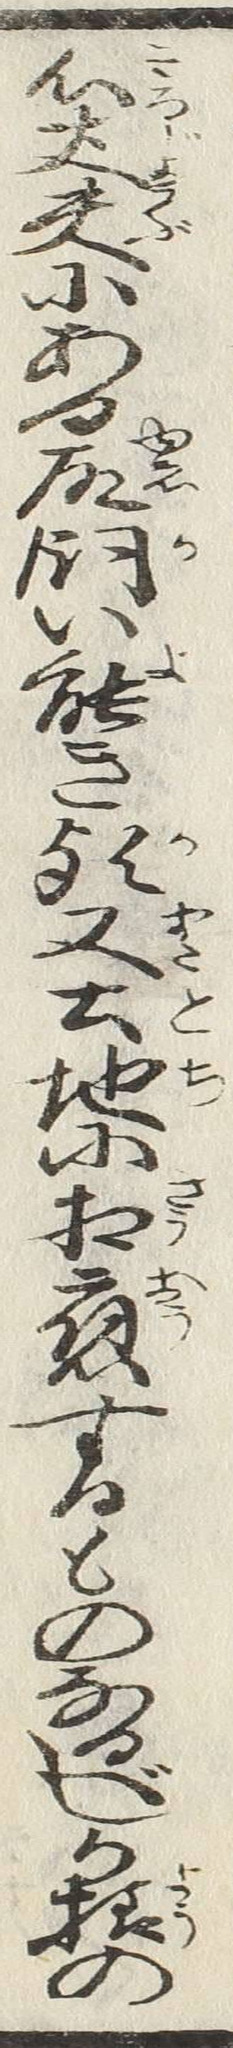心丈夫にある故飼い能き歟又土地に相應するものなるべしか様の
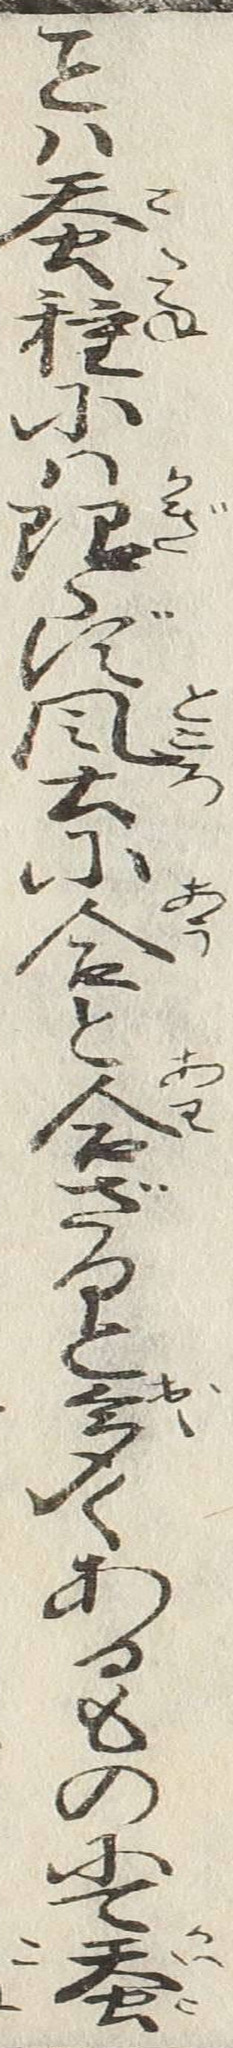ことは蚕種には限らず風土に合と合ざると多くあるものにて蚕
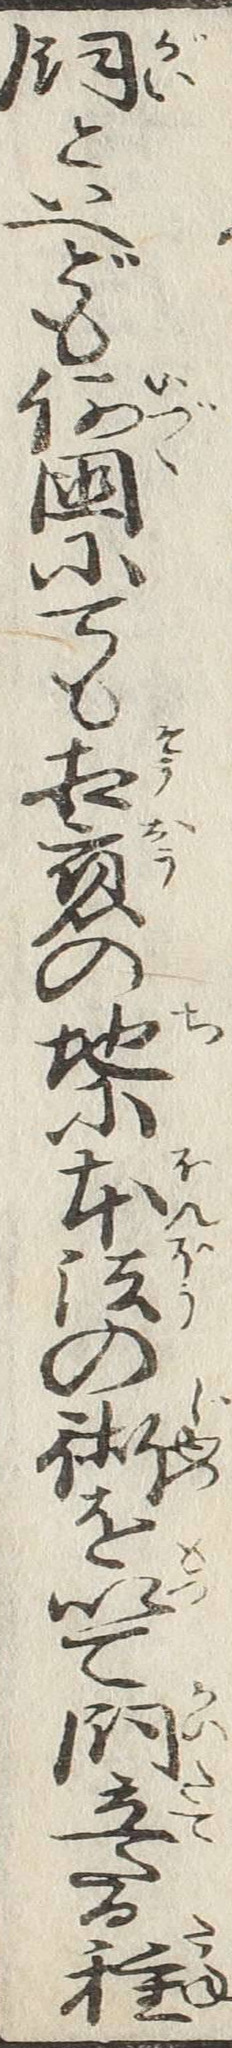飼といへども何國にても相應の地に本法の術を以て飼立たる種
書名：養蠶實驗録
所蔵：東京大学農学生命科学図書館 国文学研究資料館
